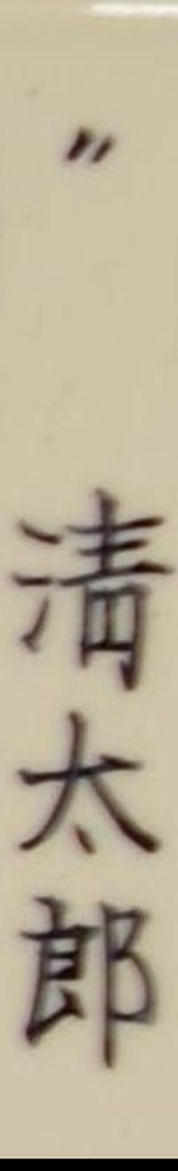清太郎
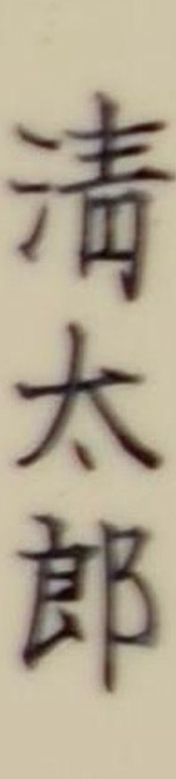清太郎
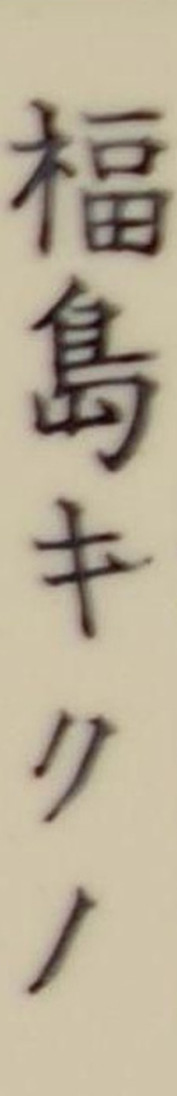福島キクノ
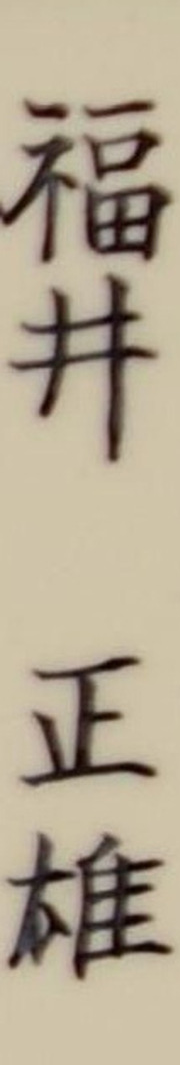福井正雄
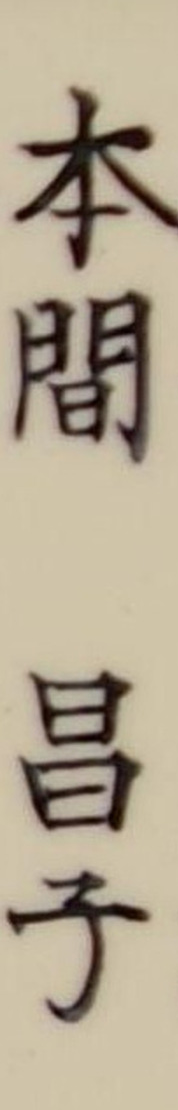本間昌子
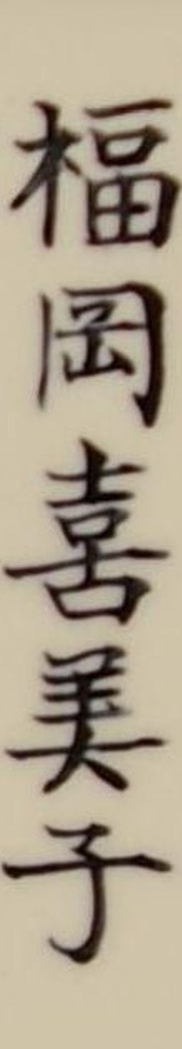福岡喜美子
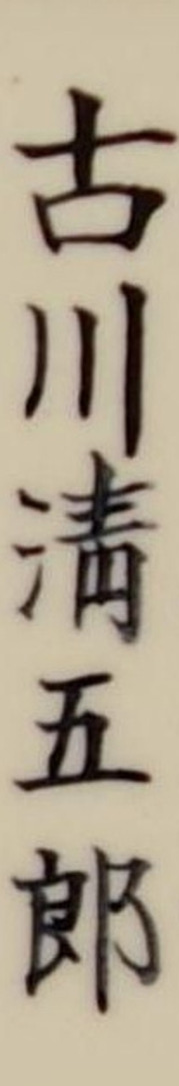古川清五郎
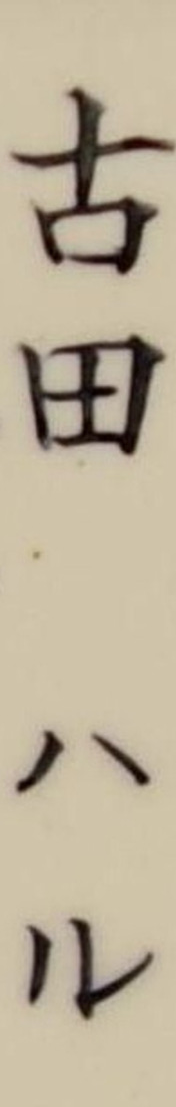古田ハル
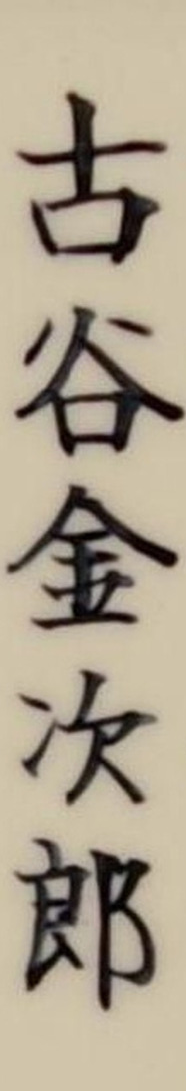古谷金次郎
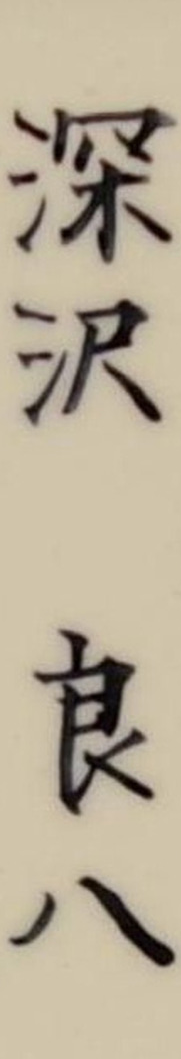深沢良八
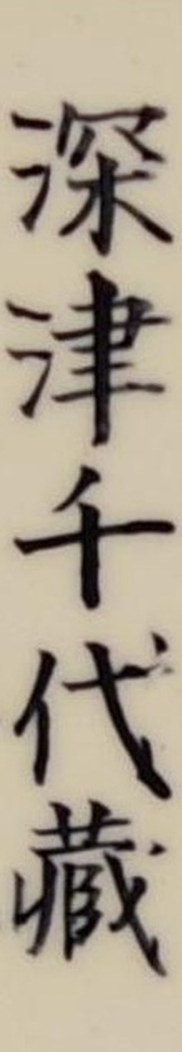深津千代蔵
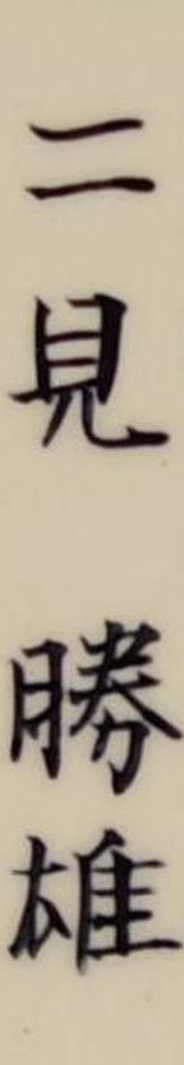二見勝雄
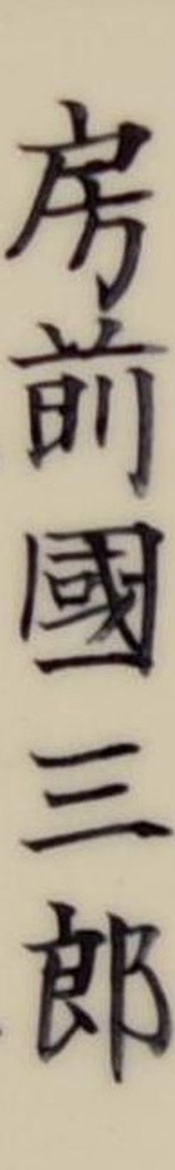房前國三郎
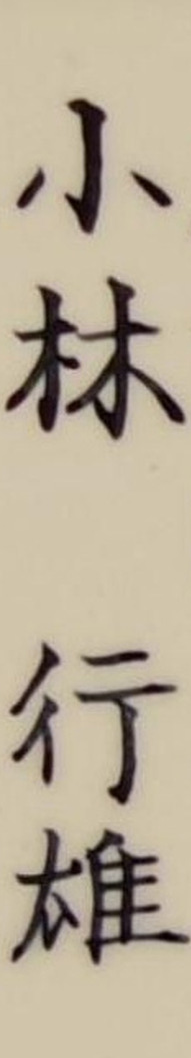小林行雄
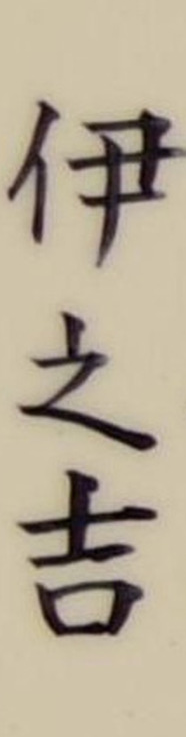伊之吉
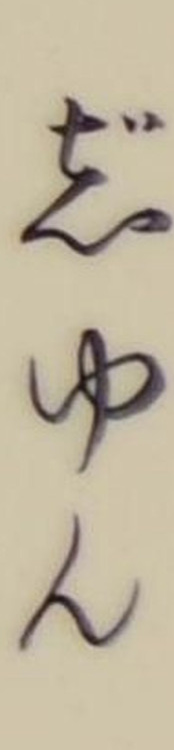じゆん
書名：E~L
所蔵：高野山金剛峯寺
